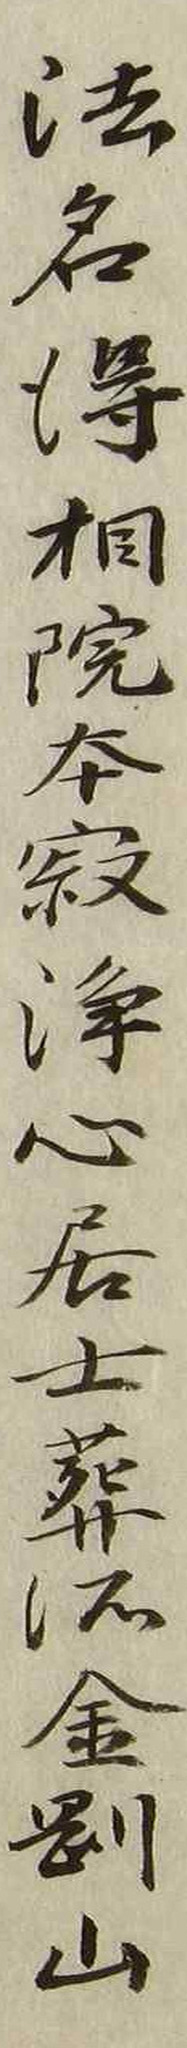法名得相院本寂浄心居士葬所金剛山
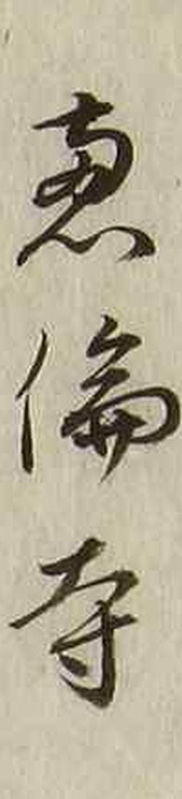恵倫寺
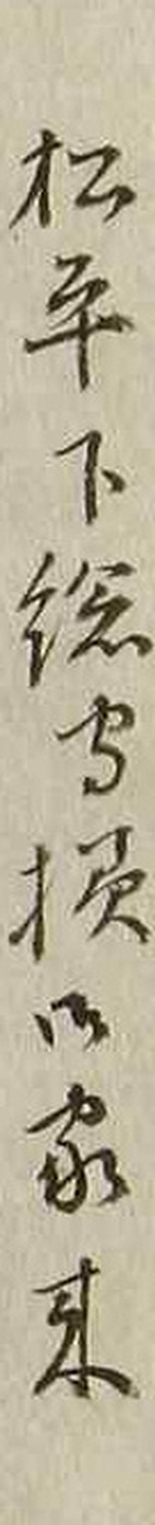松平下総守様御家来
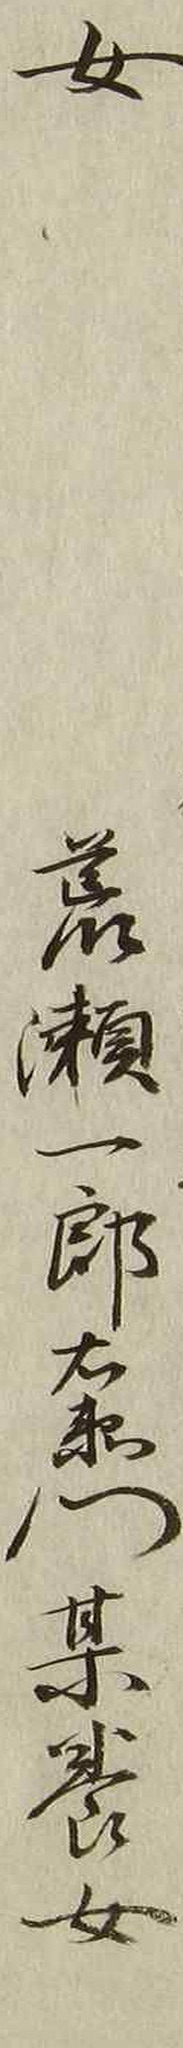女荒瀬一郎右衛門某養女
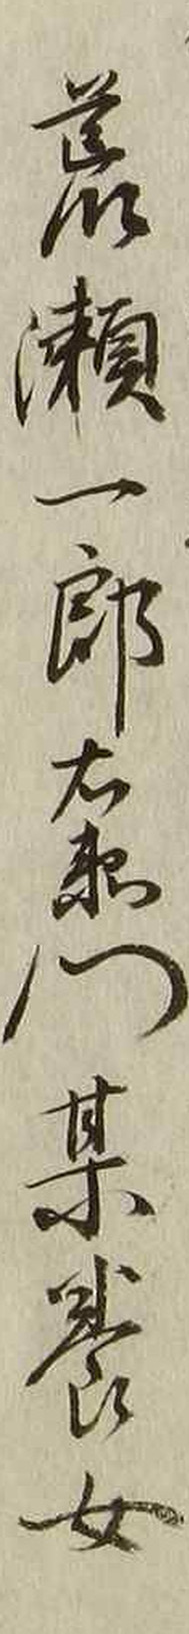女荒瀬一郎右衛門某養女
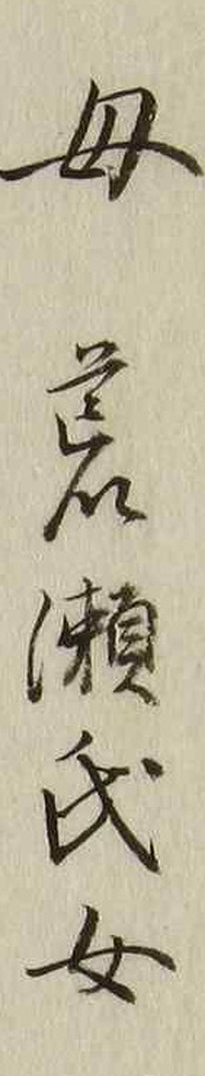母荒瀬氏女
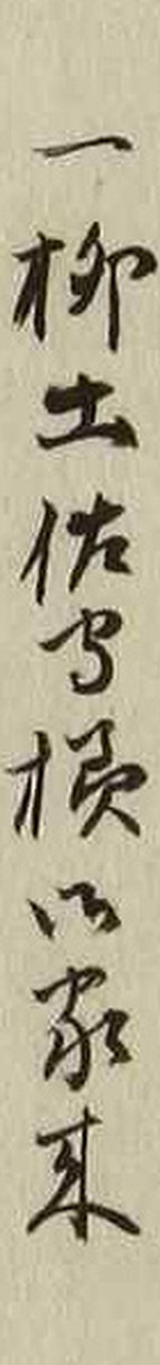一柳土佐守様御家来
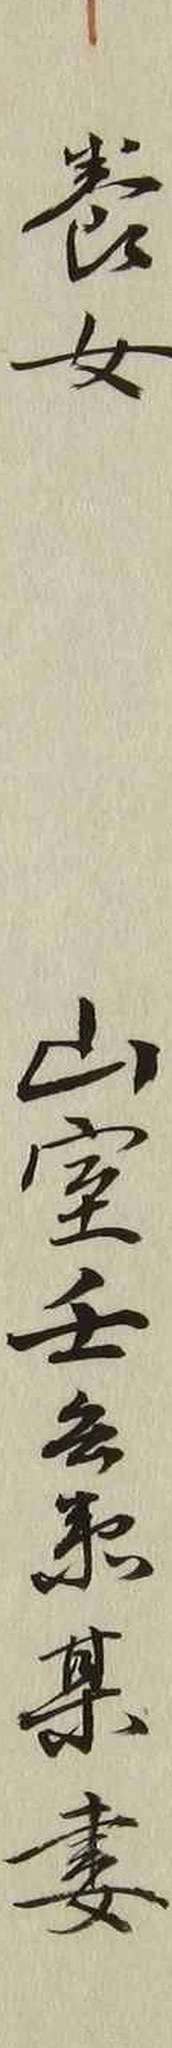養女山室壬兵衛某妻
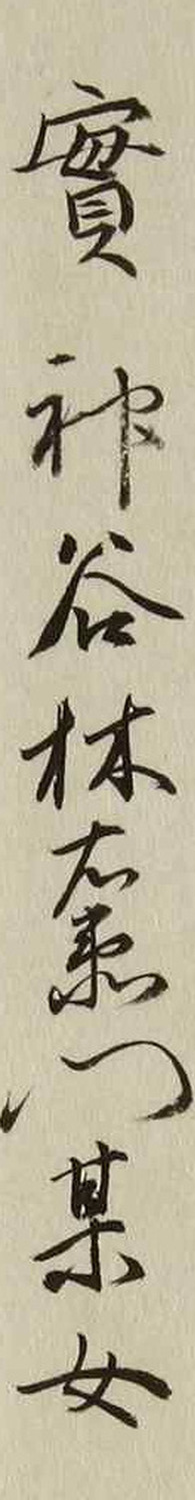実神谷林右衛門某女
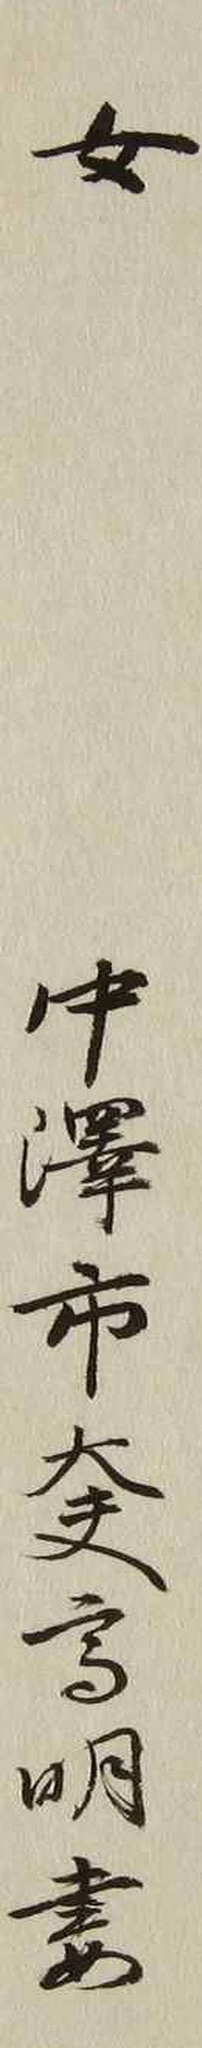女中澤市太夫高明妻
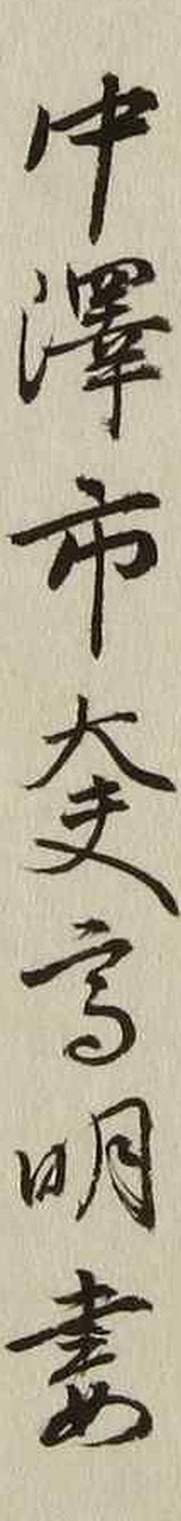女中澤市太夫高明妻
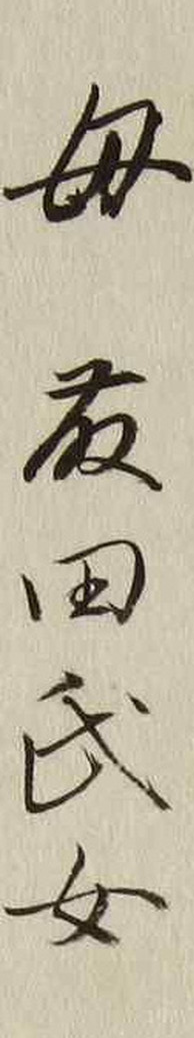母藤田氏女
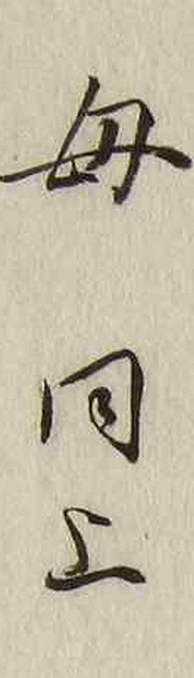母同上

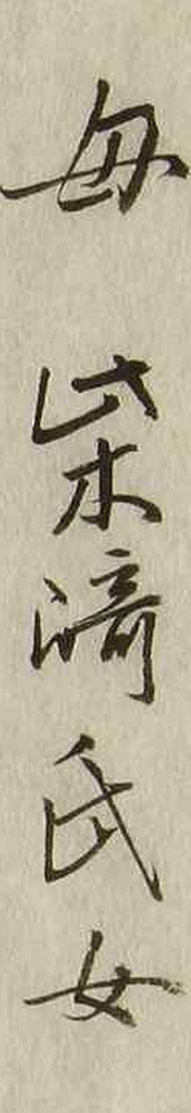母柴崎氏女
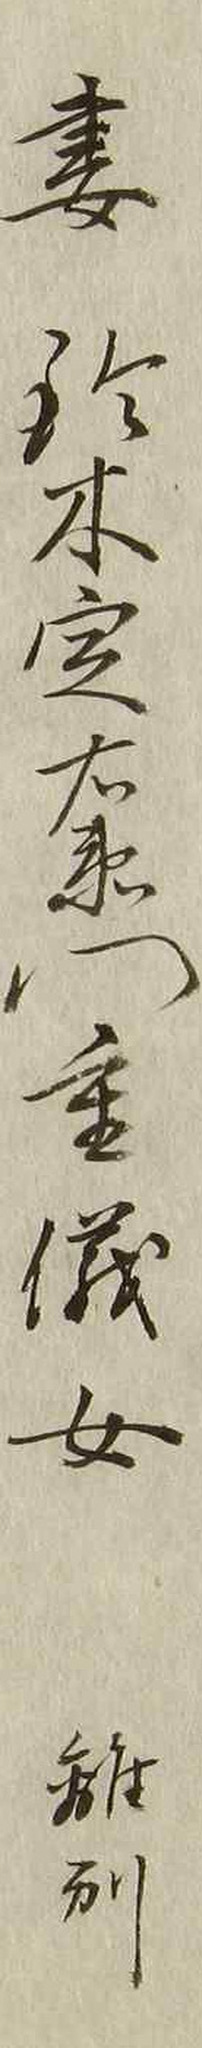妻鈴木定右衛門重儀女離別
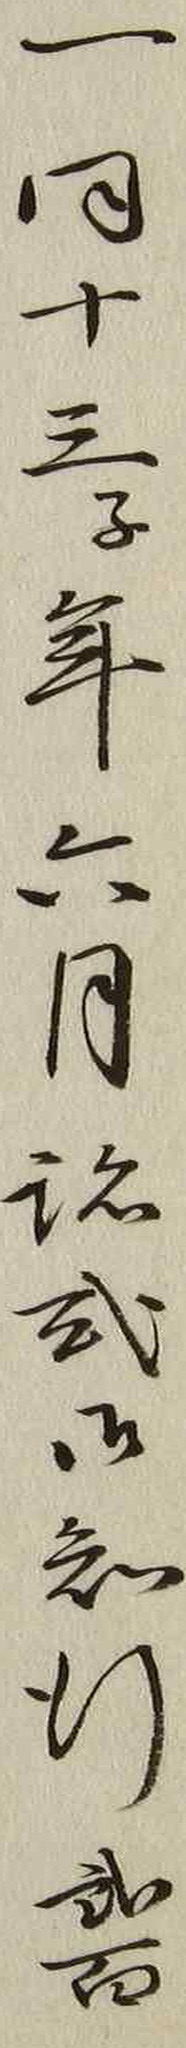一同十三子年六月諸式御知行弐百
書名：諸士系譜　巻之19　い之部19
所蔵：会津若松市立会津図書館
